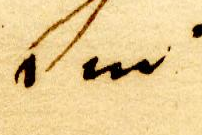Sir
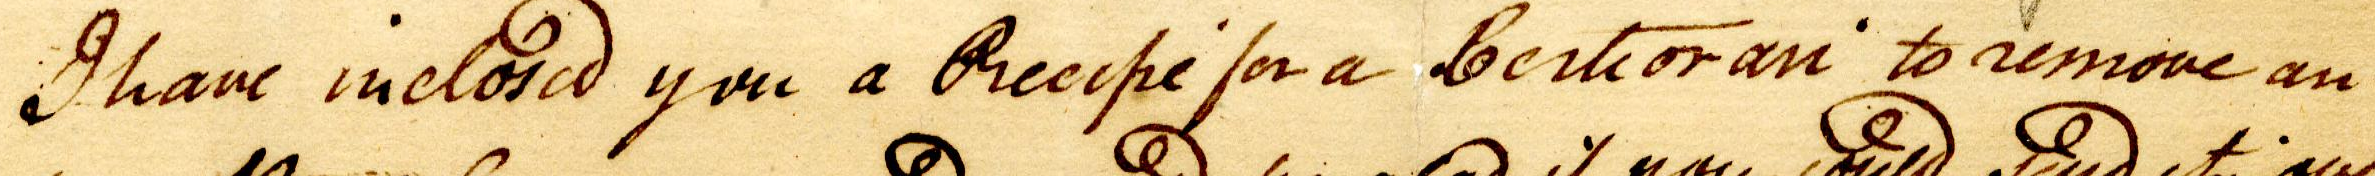I have inclosed you a Recipe for a Certiorari to remove an
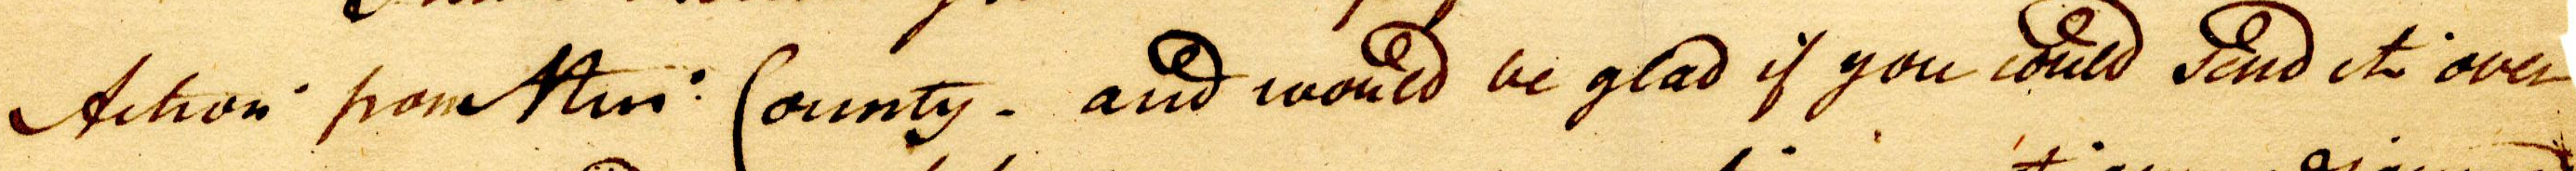Action from this County, and would be glad if you could send it over
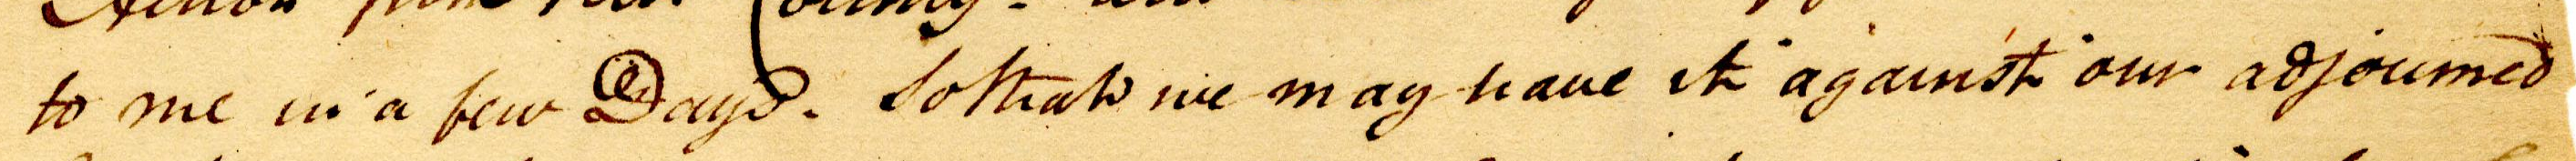to me in a few Days. So that we may have it against our adjourned
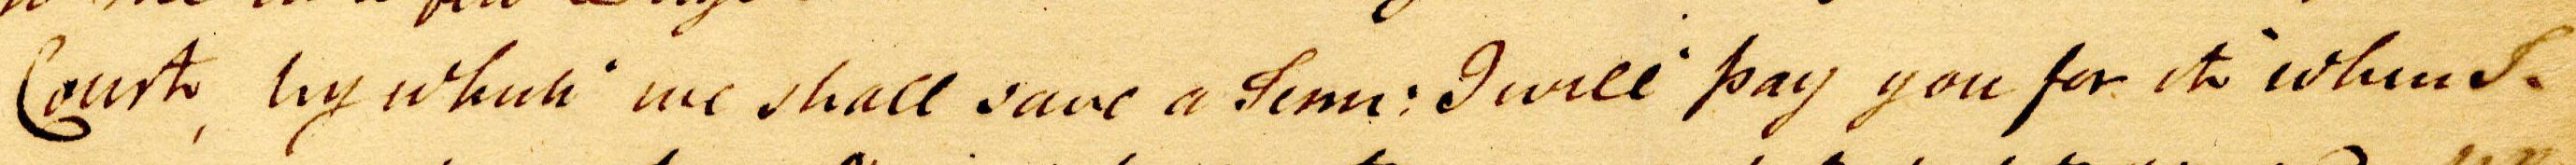Court, by which we shall save a Tem: I will pay you for it which
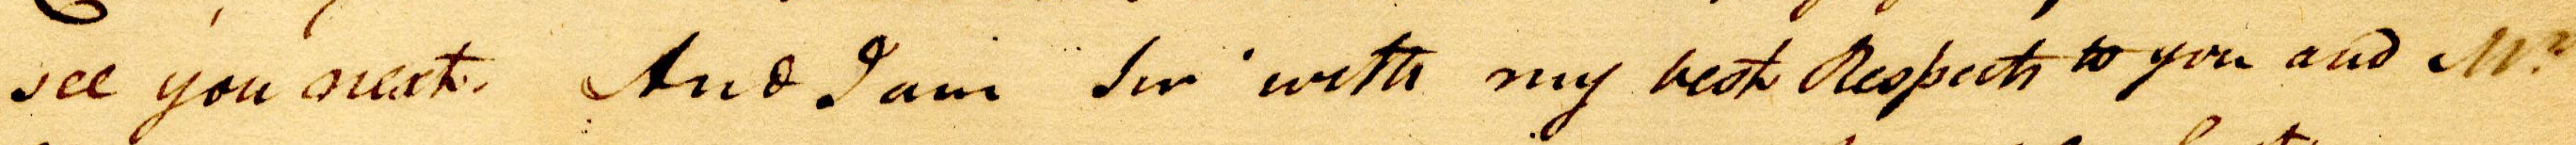see you start. And I am Sir with my best Respects to you and M^rs.
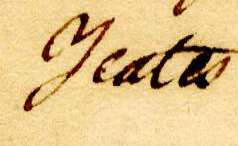Yeates
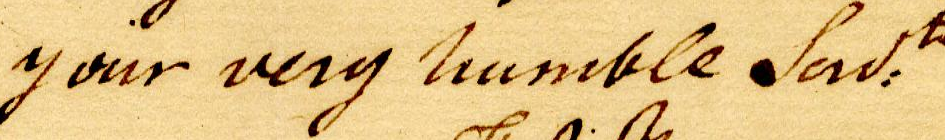your very humble Serv^t
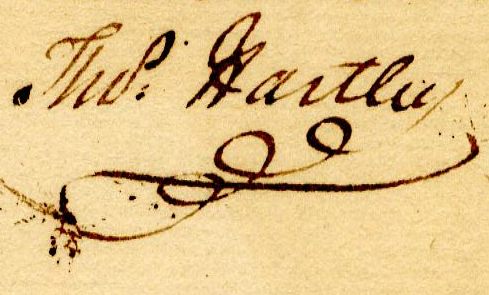Tho^s. Hartley
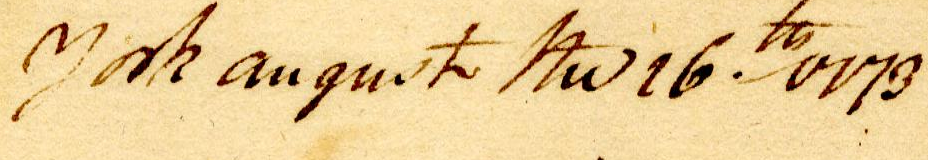York august the 16^th 1773
